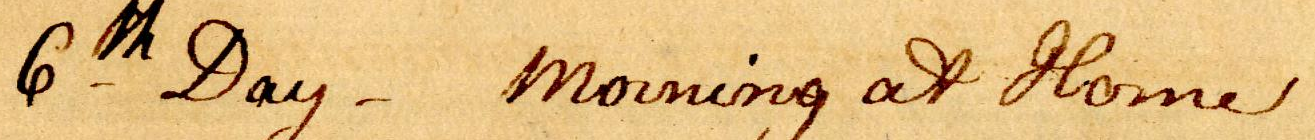6^th Day- Morning at Home
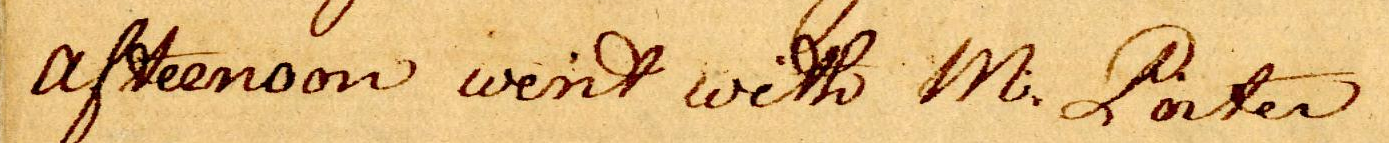Afternoon went with M. Porter
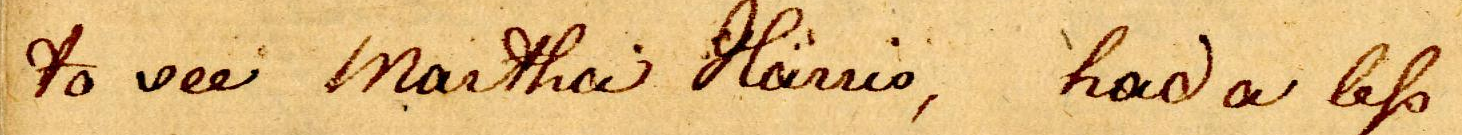to see Martha Harris, had a less
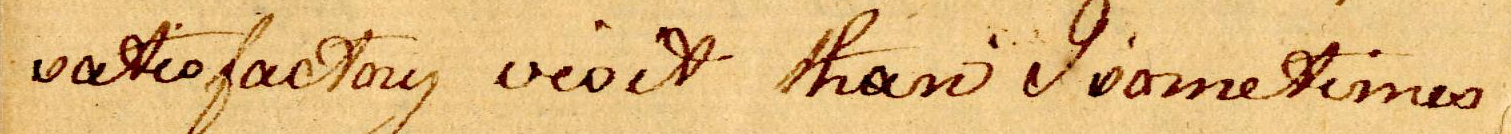satisfactory visit than I sometimes
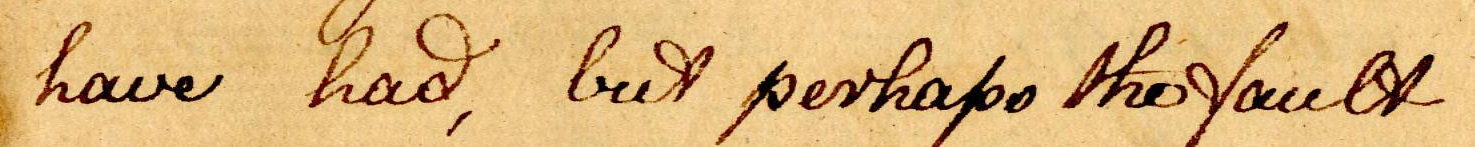have had, but perhaps the fault
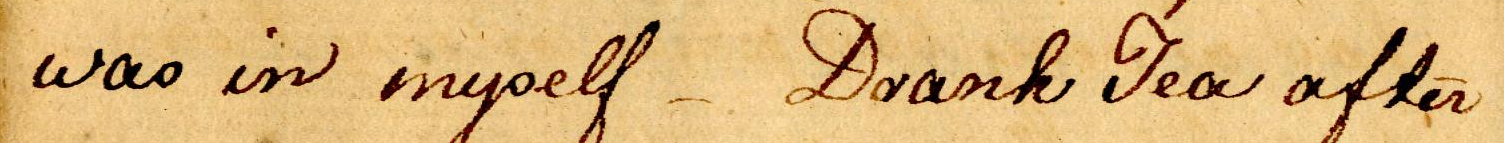was in myself- Drank Tea after
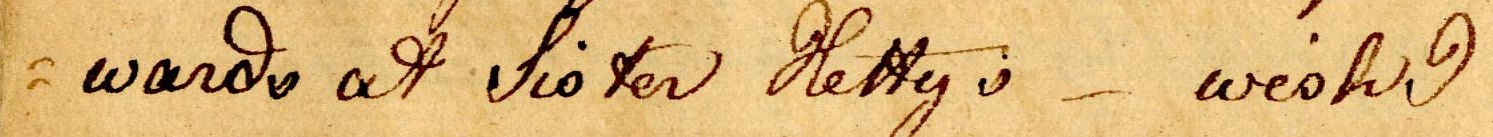-wards at Sister Hetty's- wish I
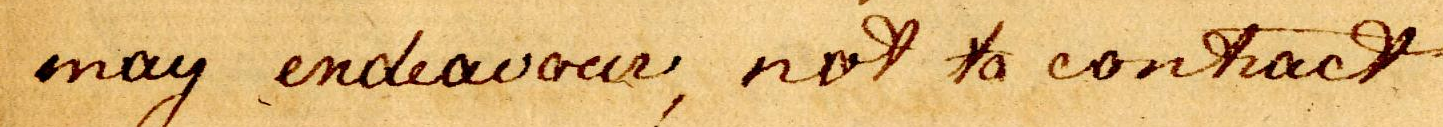may endeavour, not to contract
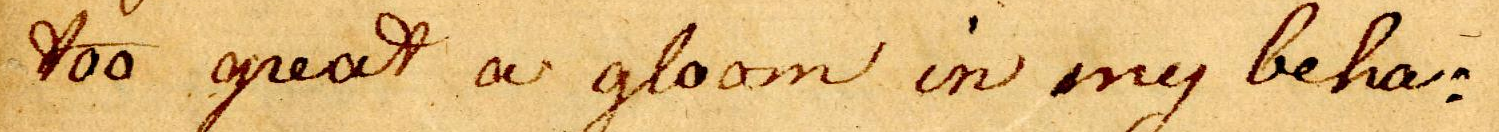too great a gloom in my beha-
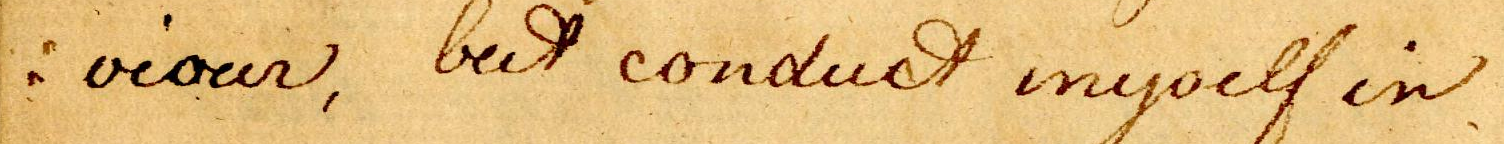-viour, but conduct myself in
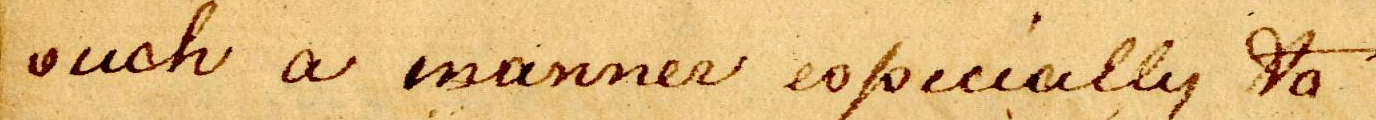such a manner especially to
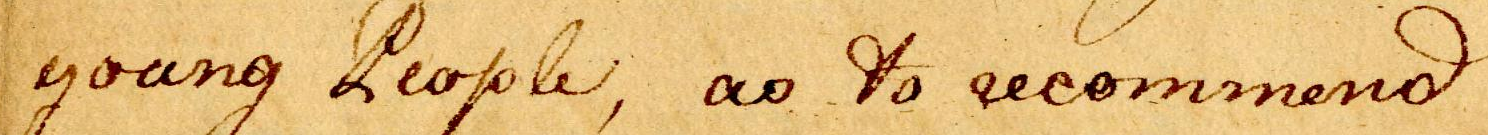young People, as to recommend
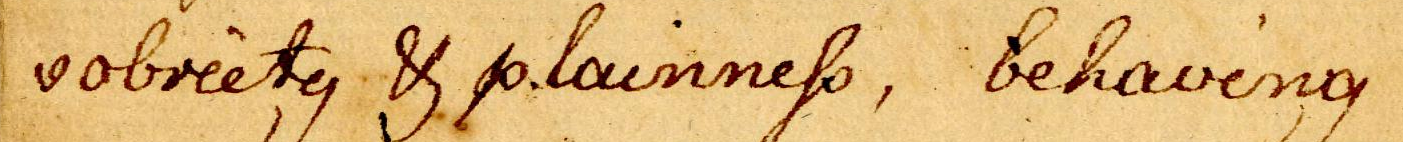sobriety & plainness, behaving
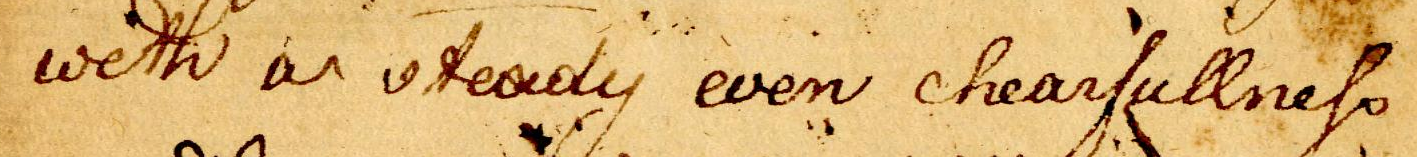with a steady even chearfullness
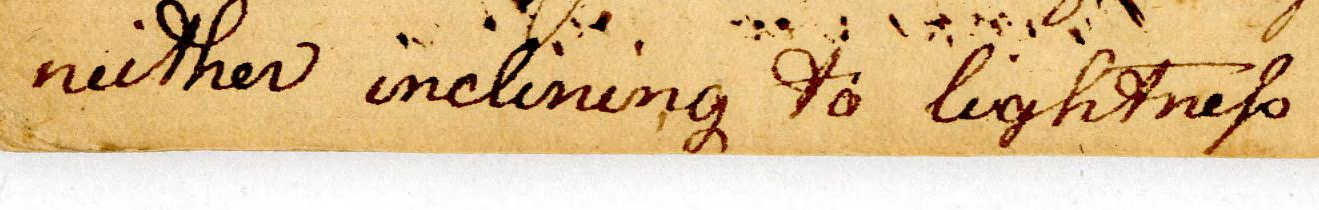neither inclining to lightness
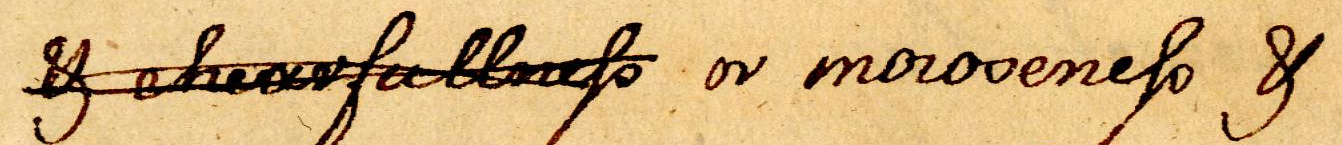[& chearfullness] or moroseness &
